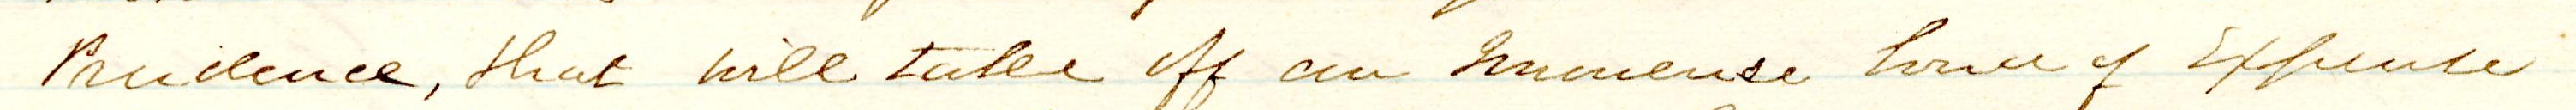Prudence, that will take off our promise here of expense
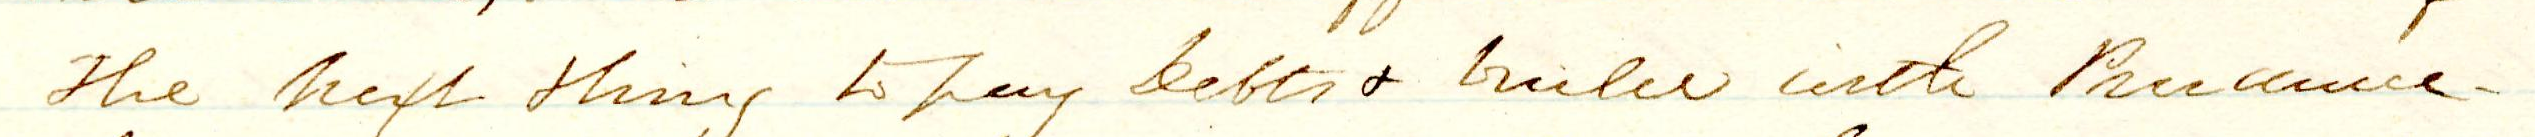the next thing is pay Debts & build with Prudence.-
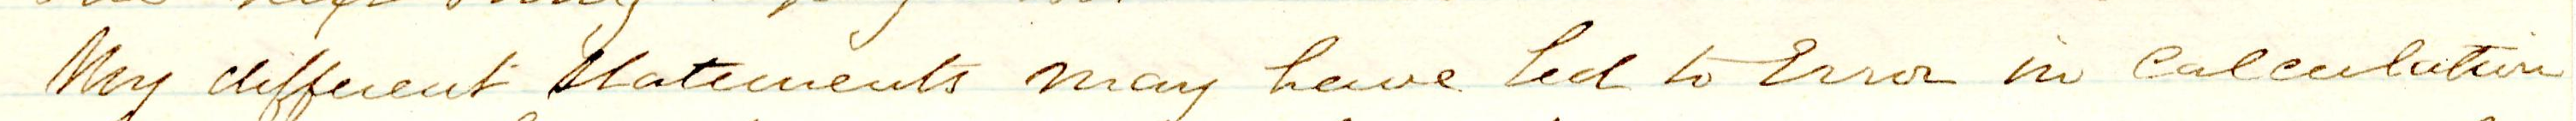My difficult Statements may have led to Error in Calculation
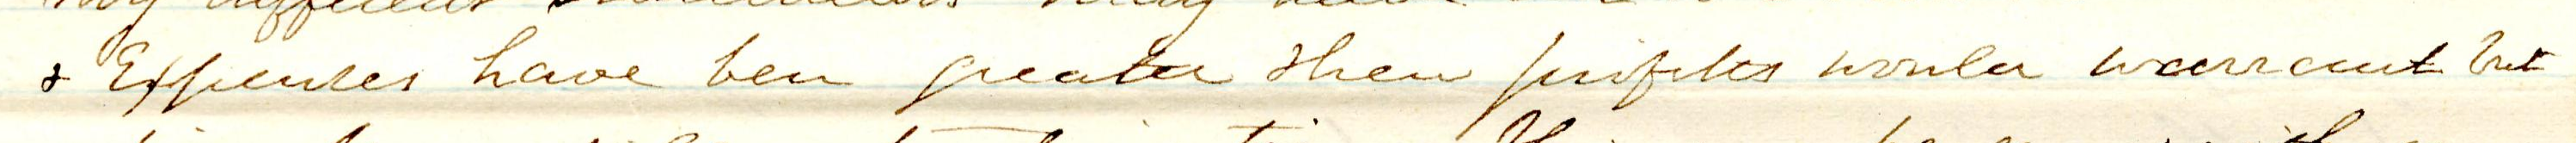& Expences have been greater then profits would warrant but
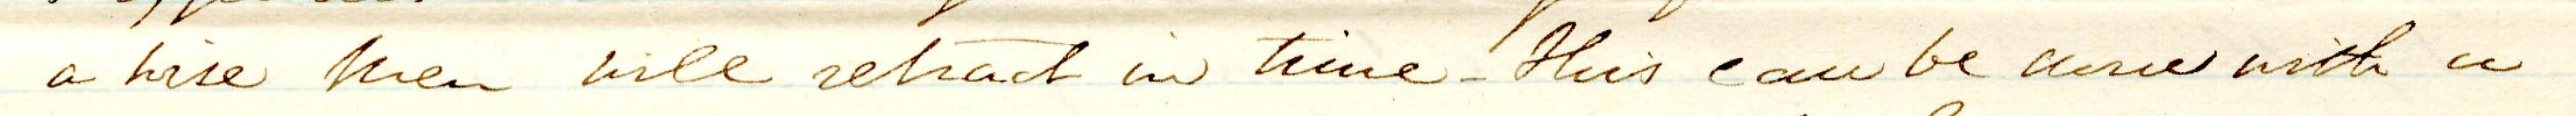a rose then will retract in time- This can be acrue with a
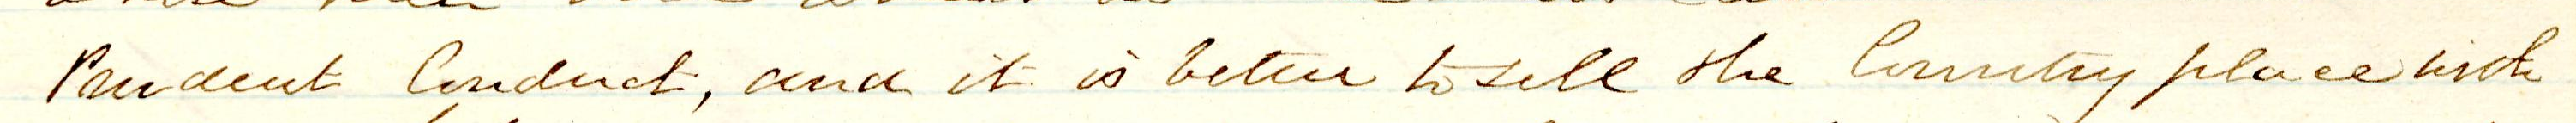prudent conduct, and it is better to sell the Country place with
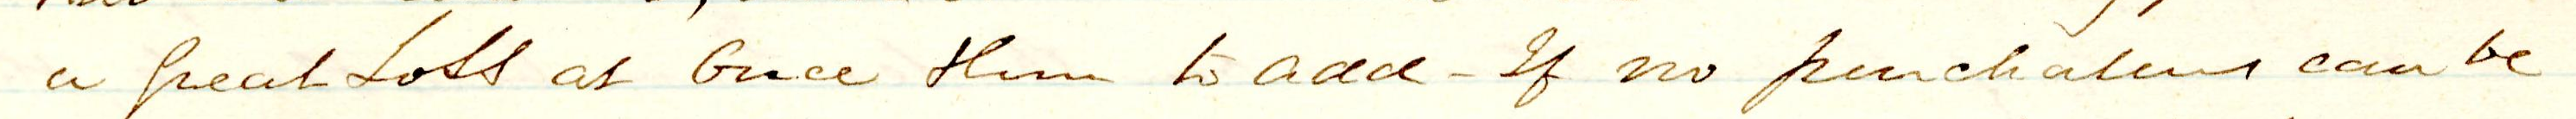a great Loss at once than to add- If no purchase can be
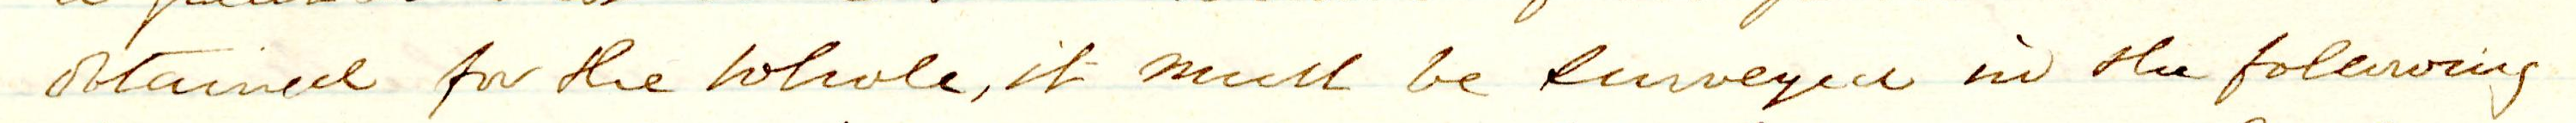obtained for the whole it must be surveyed in the following
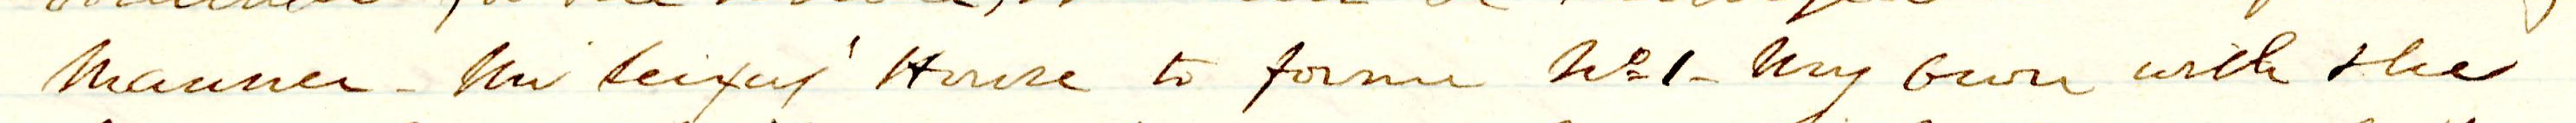Manner- Mr Seixas' House to form N^o 1.- my own with the
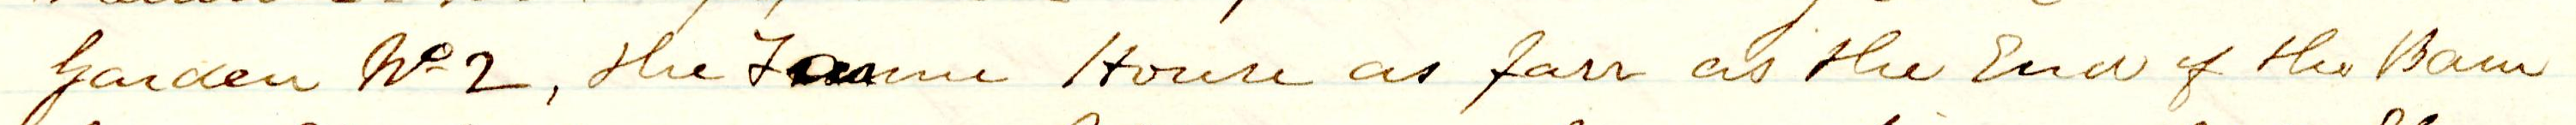Garden N^o 2, the same House as farr as the End of the Barn
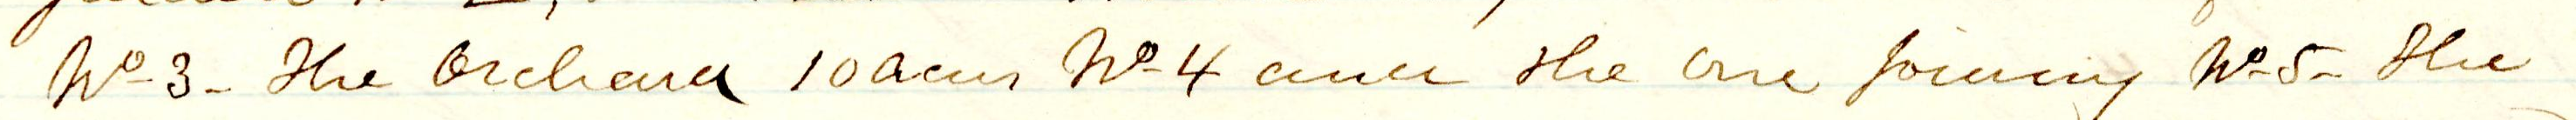N^o 3.- The orchard 10 acres N^o 4 acres the are Joining N^05.- The
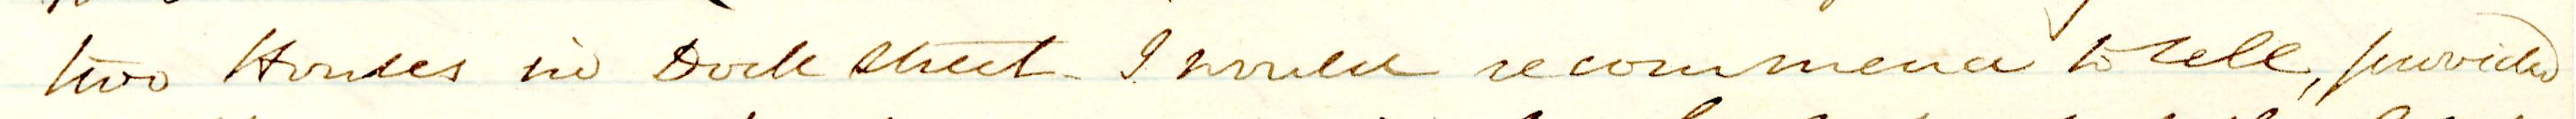two Houses in Dock street, I would recommend to sell, provided
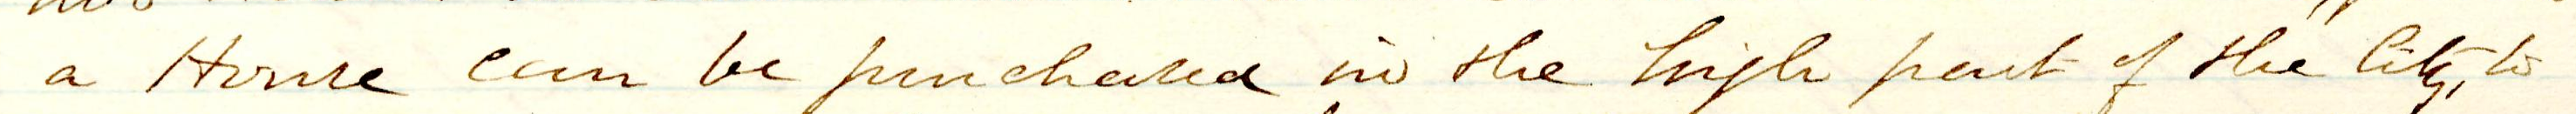a Housee can be purchased in the high part of the city, to
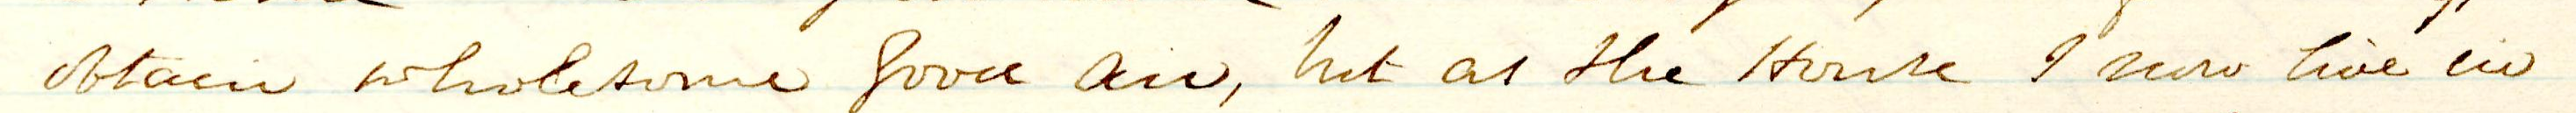obtain wholesome good air, but as the house I now live in
